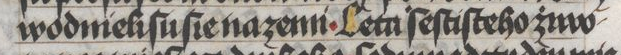wodnieli ſu ſie na zemi.Leta ẛeſtiſteho żiwo¬
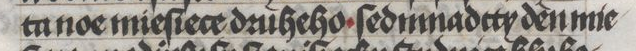ta noe mieſiece druheho.ſedmnadcty den mie¬
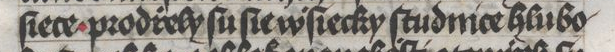ſiece.prodṙely ſu ſe wẛiecky ſtudnice hlubo¬
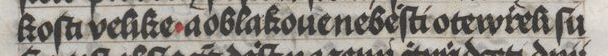koſti velike.a oblakoue nebeẛtí otewṙeli ſu
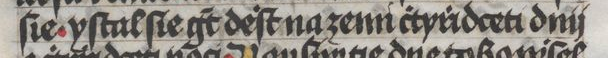ſie. yſtal ſie ḡt deẛt na zemi ċtyṙidceti dnij
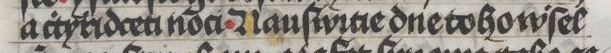a ċtyṙidceti noci.Nauſvitie dne toho wẛel
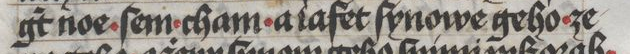ḡt noe.ſem.cham.a iaſet ſynowe geho.ze¬
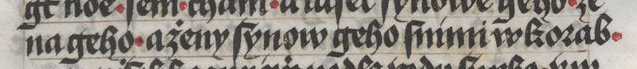na geho.a żeny ſynow geho ſními wkorab.
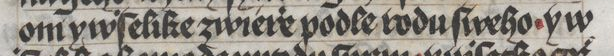oni y wẛelike zwieṙe podle rodu ſweho.y w¬
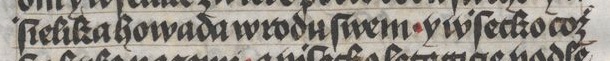ẛielika howada wrodu ſwem.y wẛecko coż
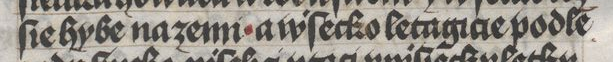ſie hybe na zemi.a wẛecko letagicie podle
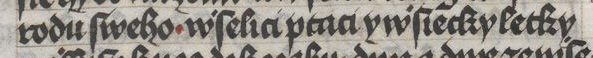rodu ſweho.wẛelici ptaci y wẛiecky letky
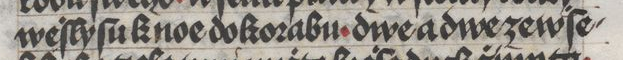weẛlyſu k noe do korabu.dwe a dwe że wẛe¬
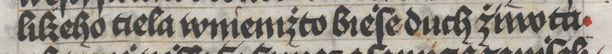likeho tiela wniemżto bíeẛe duch żiwota.
